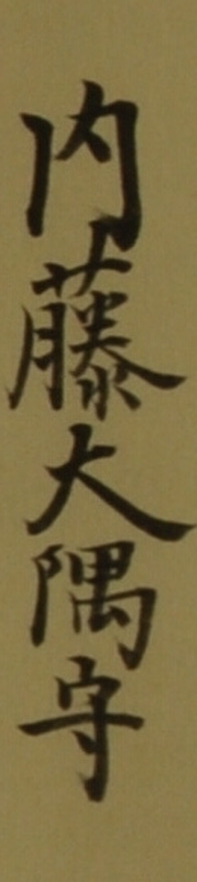内藤大隈守
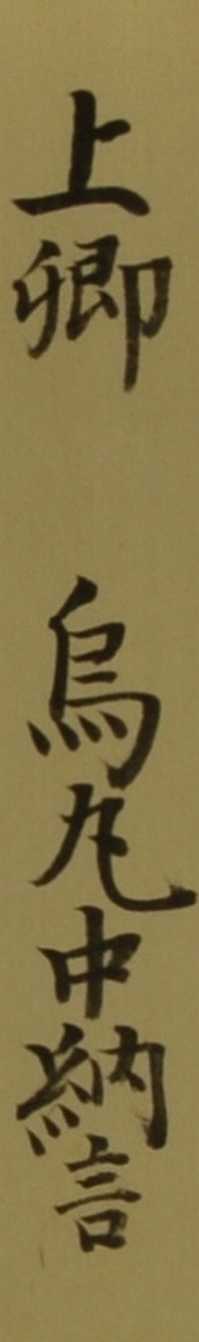上卿烏丸中納言
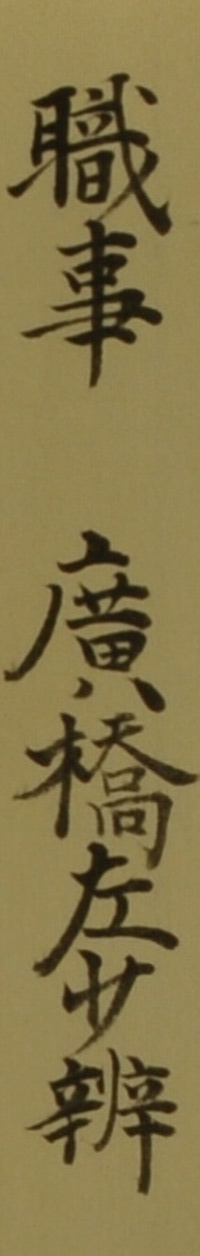職事広橋左少弁
